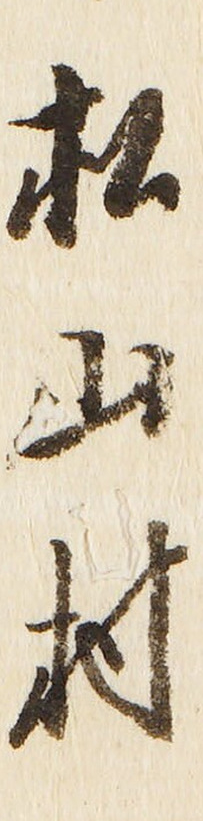松山村
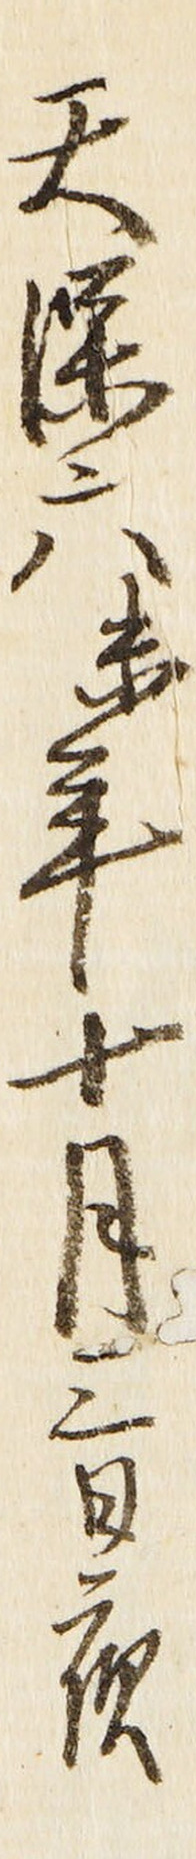天保六未年十月三日夜
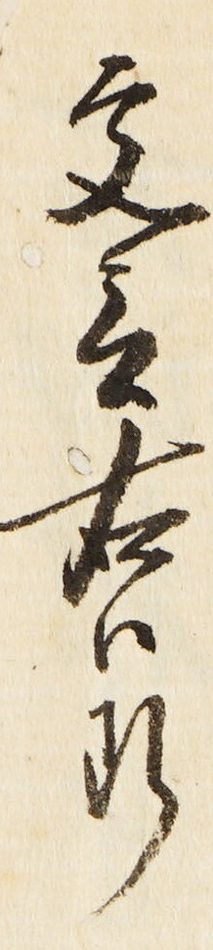文言右同断
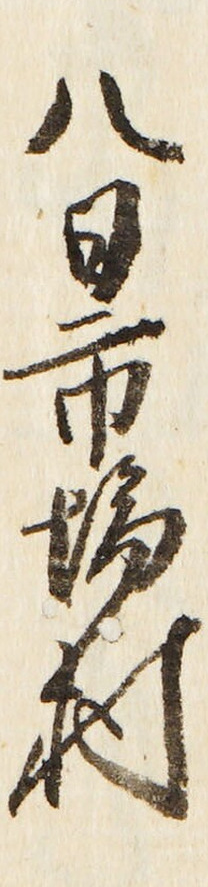八日市場村
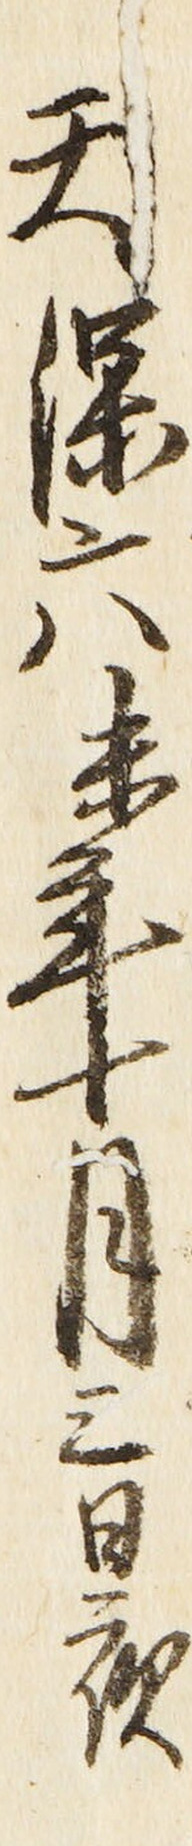天保六未年十月三日夜
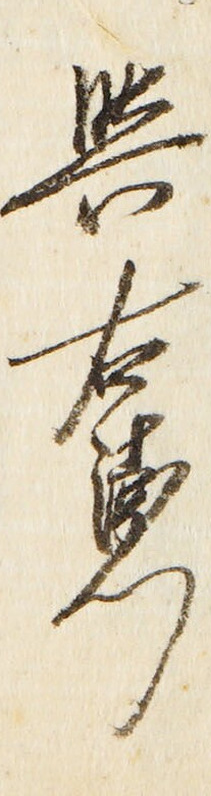与右衛門
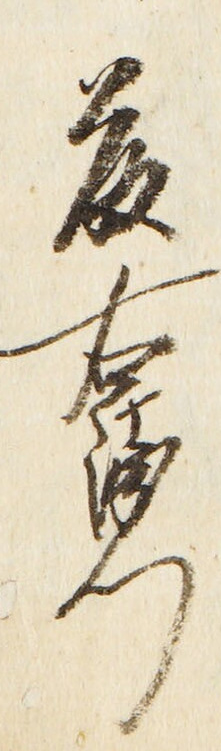藤右衛門

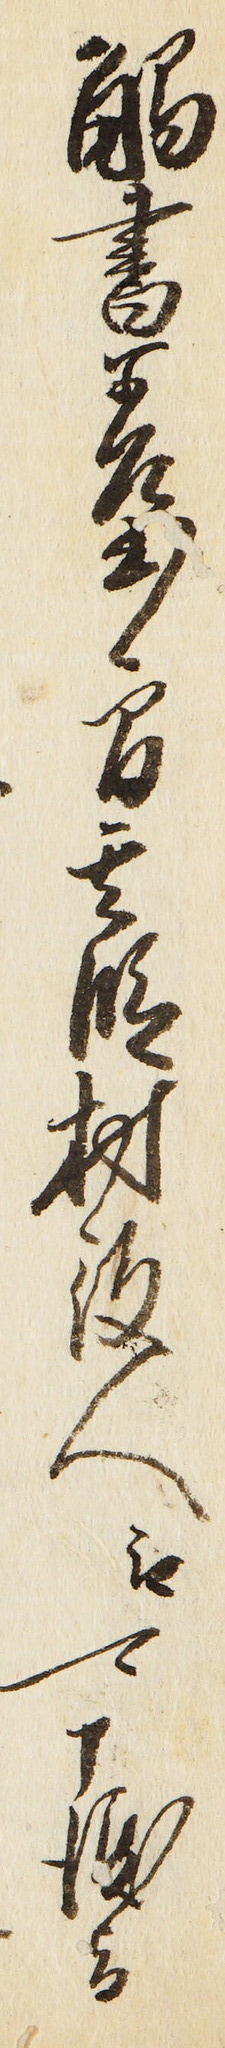触書差出候間其段村役人江可申渡旨
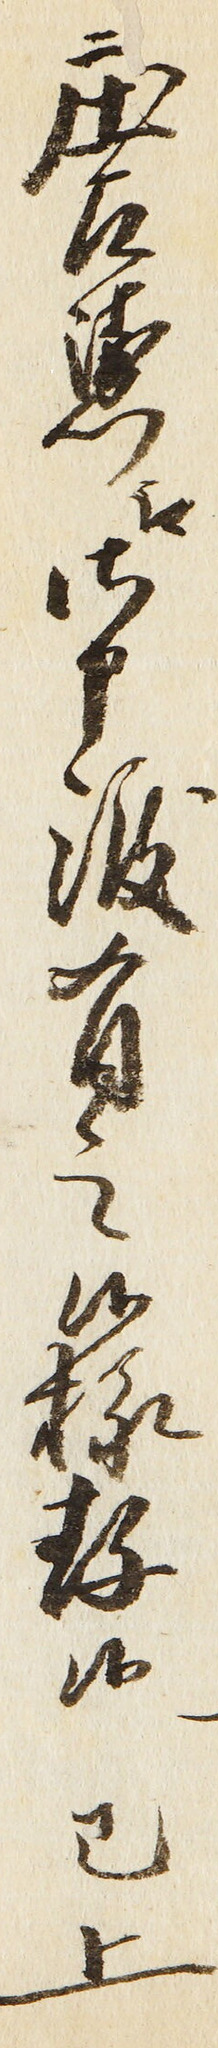庄左衛門江御申渡有之候様存候已上
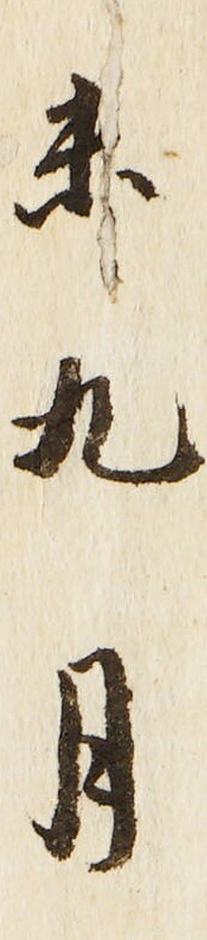未九月
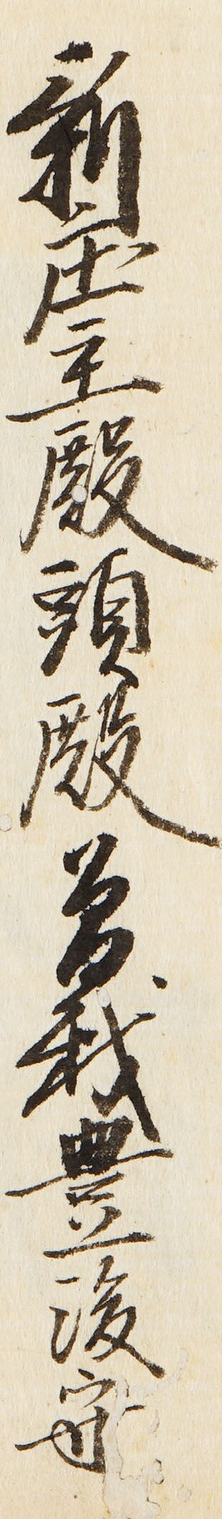新庄主殿頭殿曽我豊後守
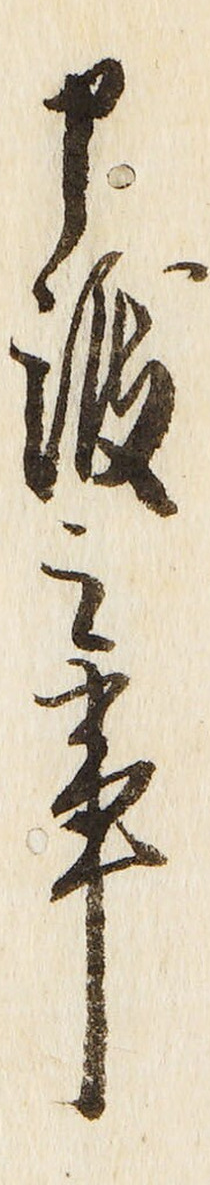申渡之事
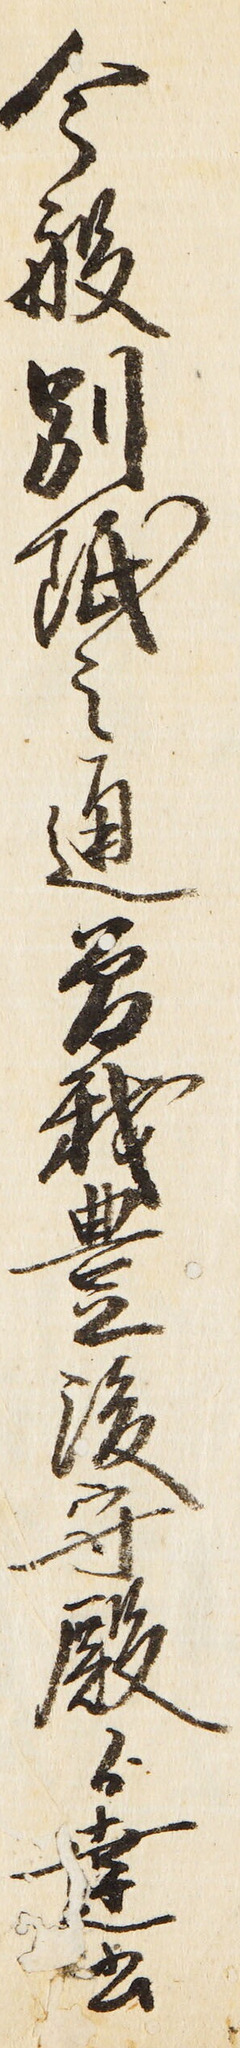今般別紙之通曽我豊後守殿ゟ達書
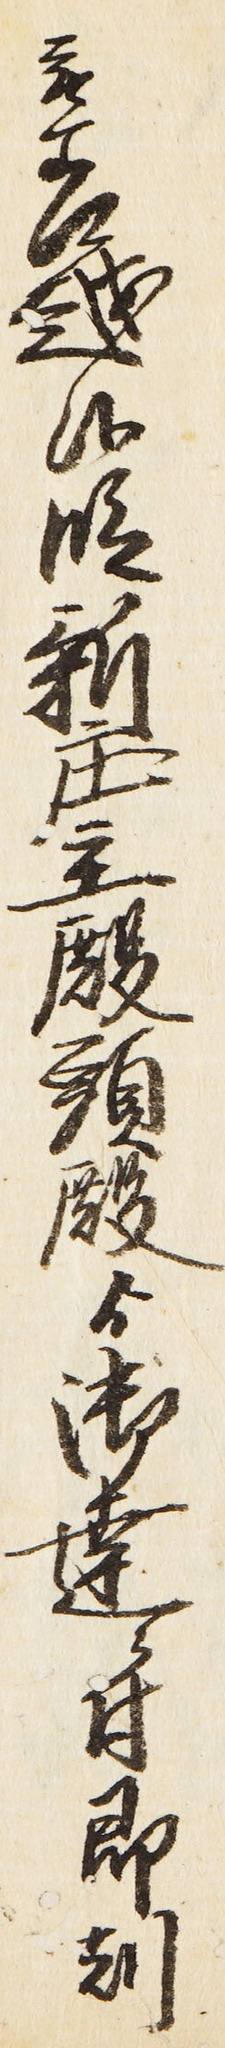被差越候段新庄主殿頭殿ゟ御達ニ付即刻
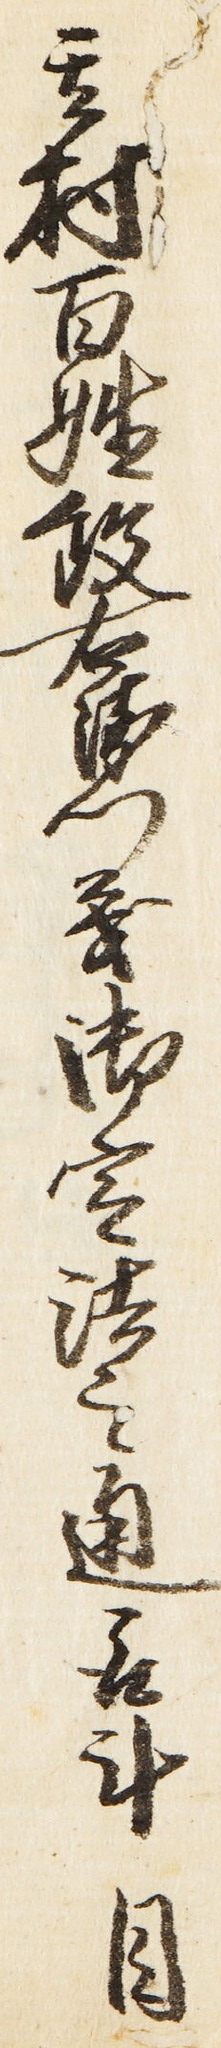其村百姓政右衛門義御定法之通取計目
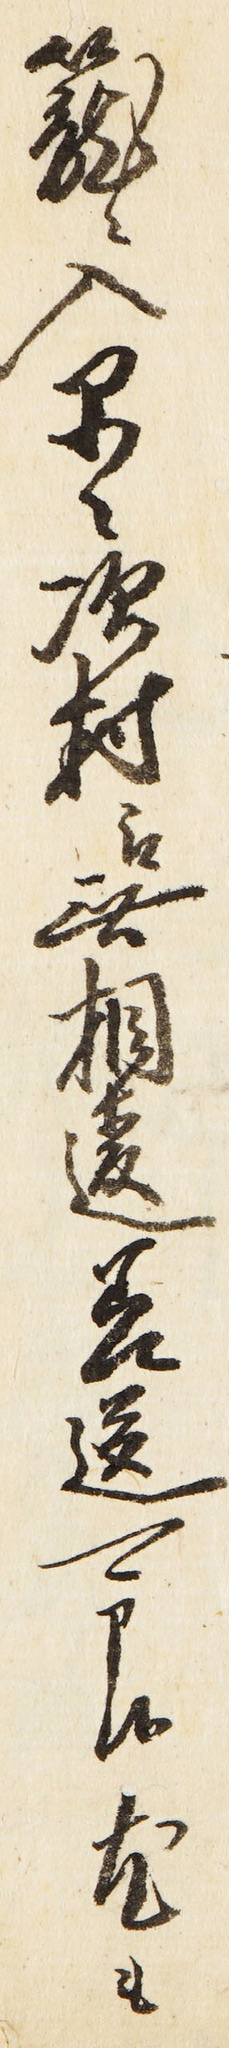籠ニ入早々次村江無相違差送可申候尤も
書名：難船一件記録
